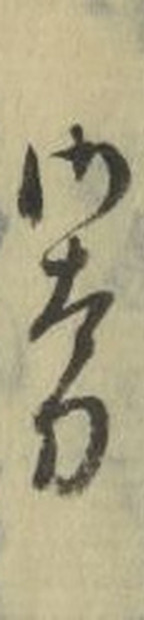御太刀
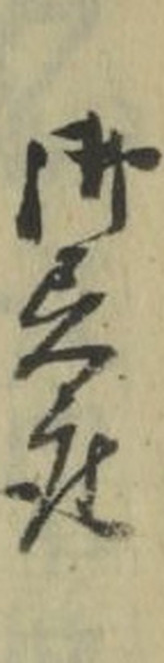御着座
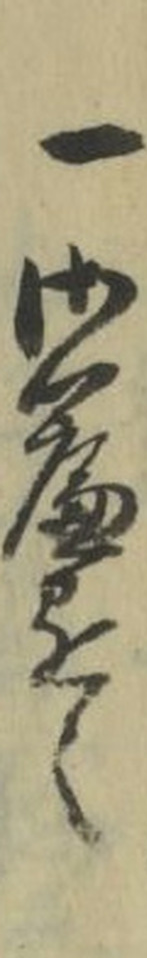一御簾懸之
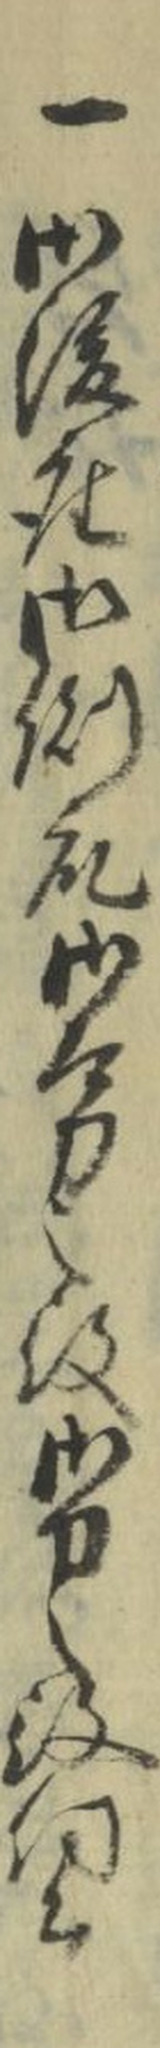一御後座御側衆御太刀之役御刀之役伺公
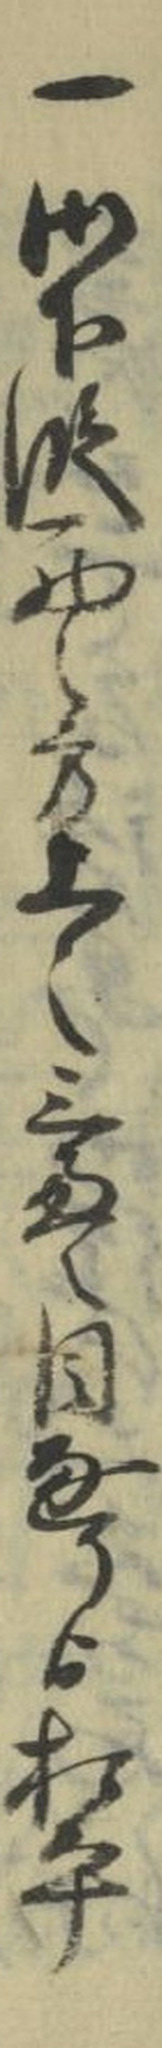一御下段西之方上之三畳目通りゟ松平
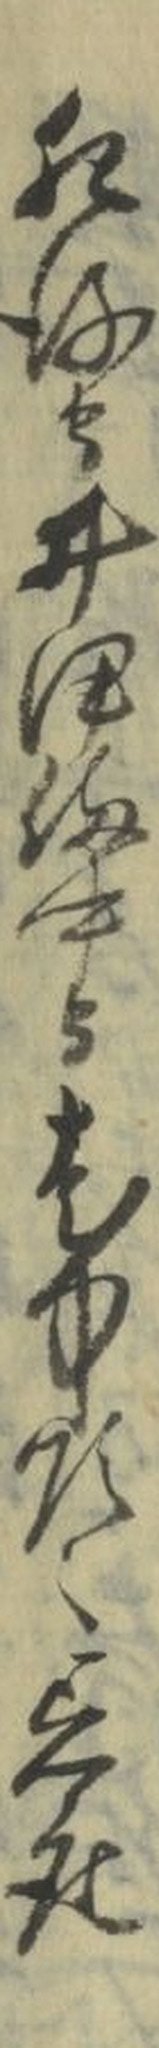肥後守井伊備中守老中順々着座
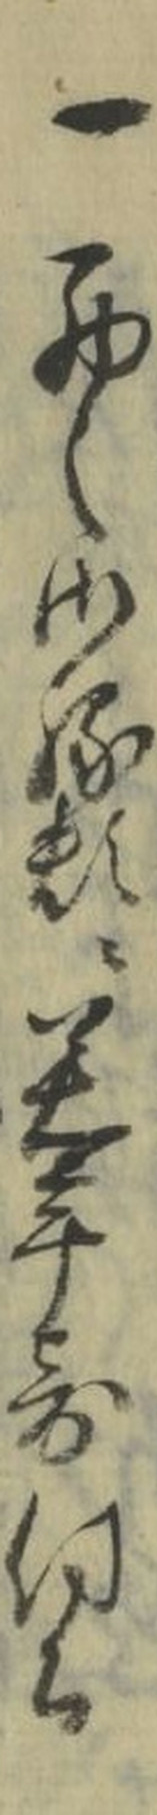一西之御縁頬に若年寄伺公
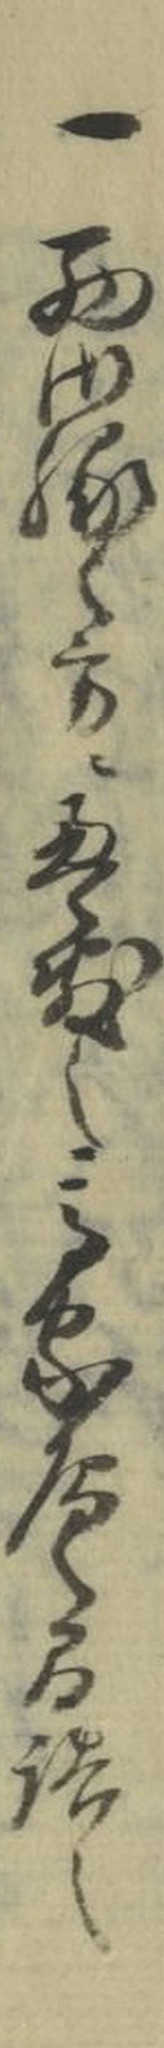一西御縁之方に畳敷之高家鴈之間詰之
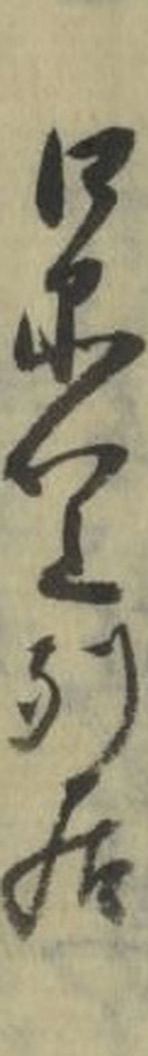四品以上列居
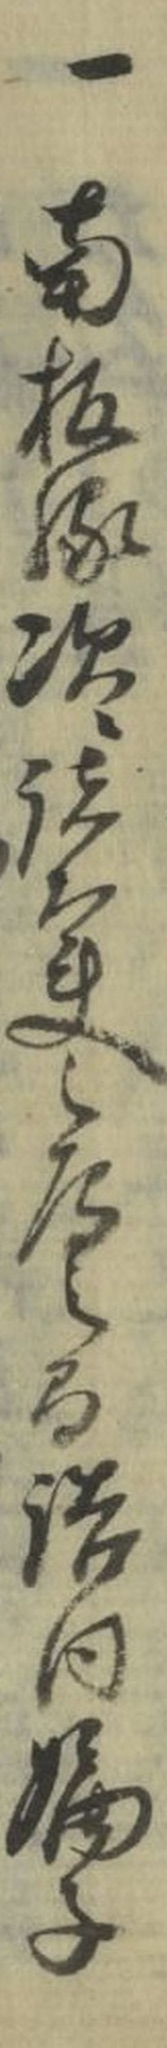一南板縁次に諸大夫之雁之間詰同嫡子
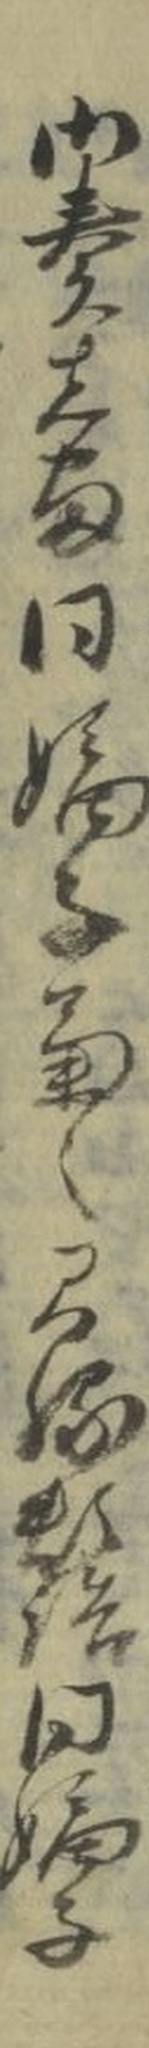御奏者番同嫡子菊之間縁頬詰同嫡子
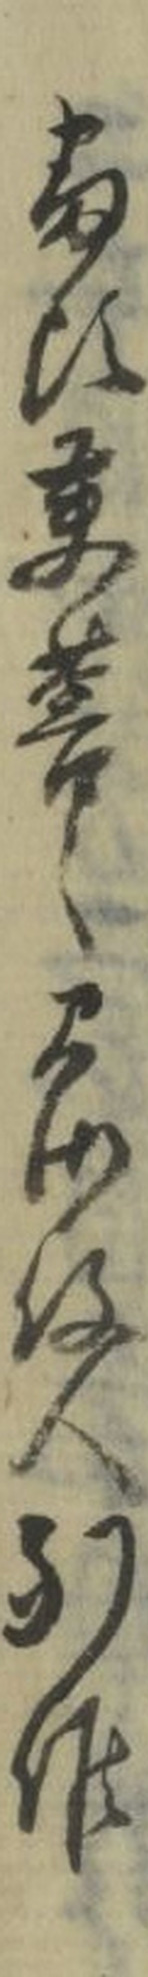番頭芙蓉之間御役人列候

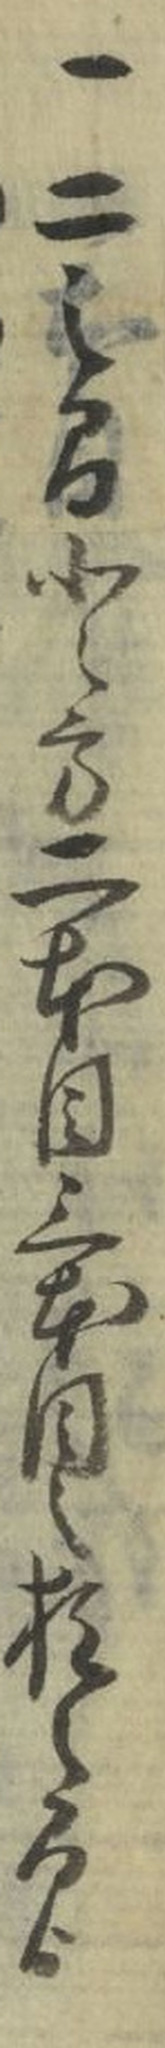一二之間北之方二本目三本目之柱之間ゟ
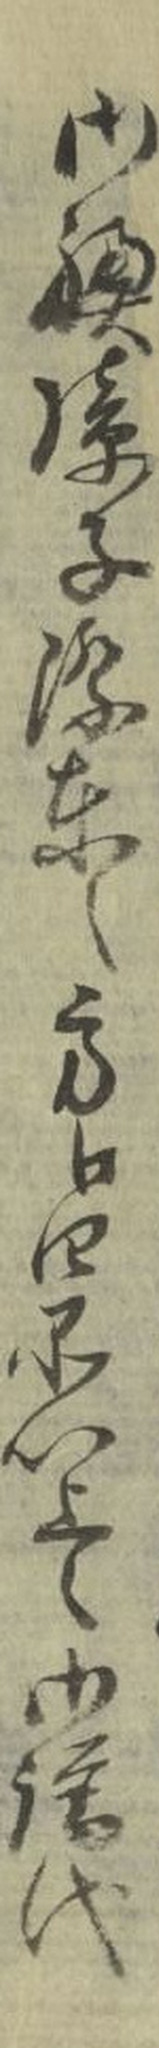御襖障子際東之方え四品以上之御譜代
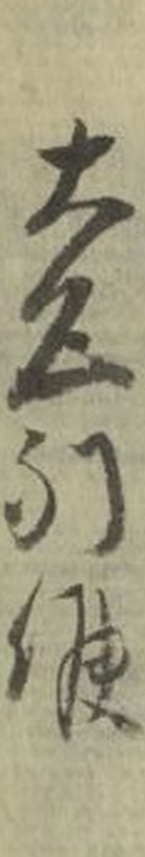大名列候
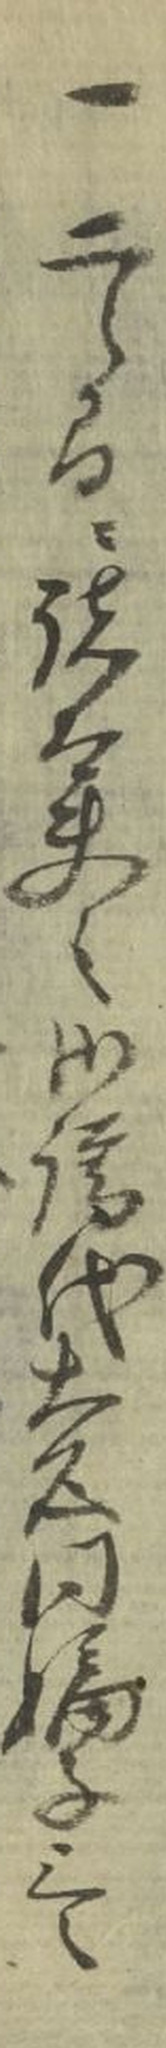一二之間に諸大夫之御譜代大名同嫡子三之
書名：戊辰琉球人来朝之式 全
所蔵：University of the Ryukyus Library
